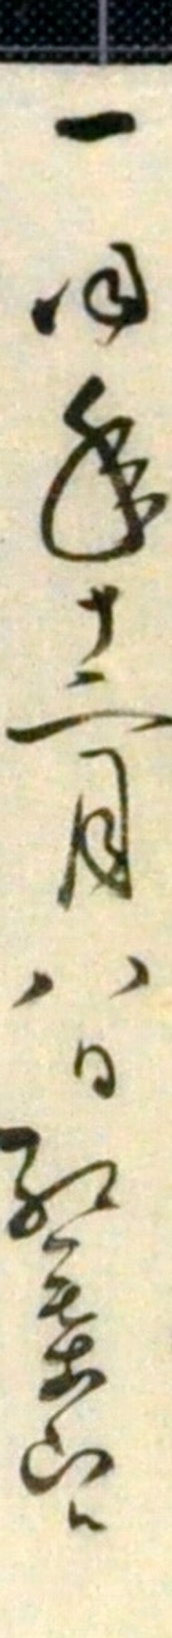一同年十二月八日紅葉山江
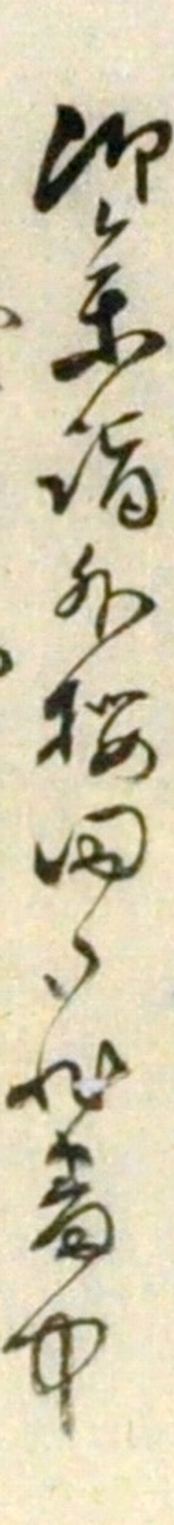御参詣外桜田御非番中
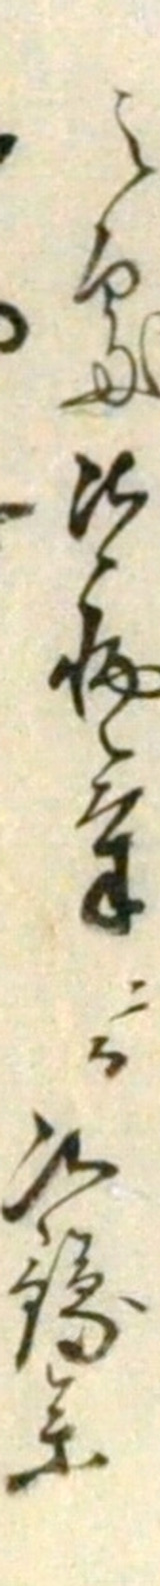之処御病気ニ而御予参
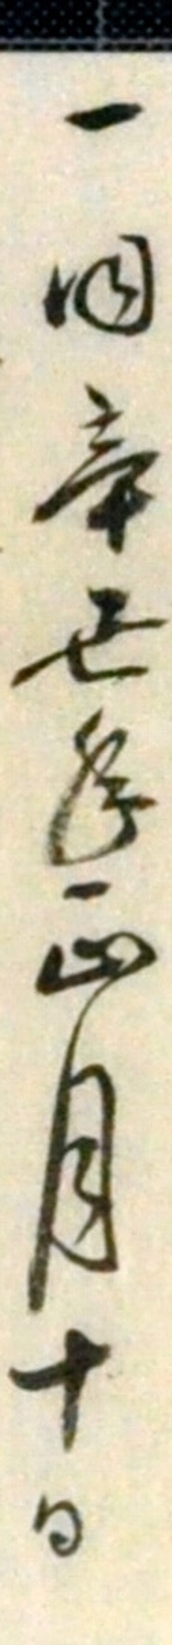一同辛丑年正月十日
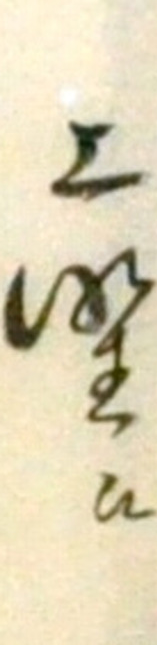上野江
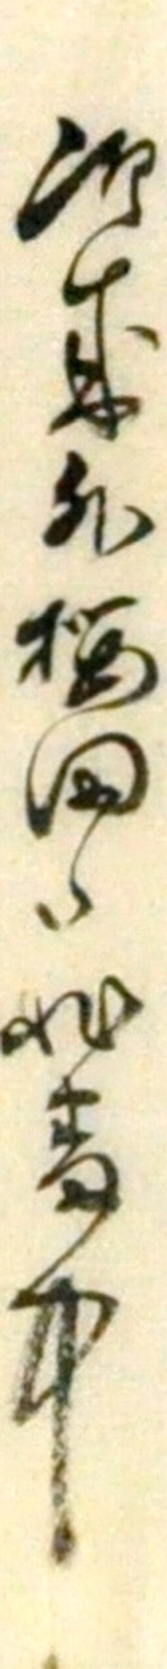御成外桜田御非番中
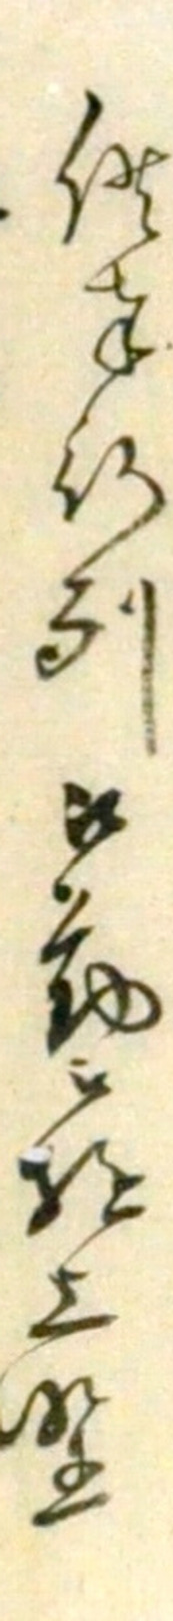供奉行列御勤被遊上野
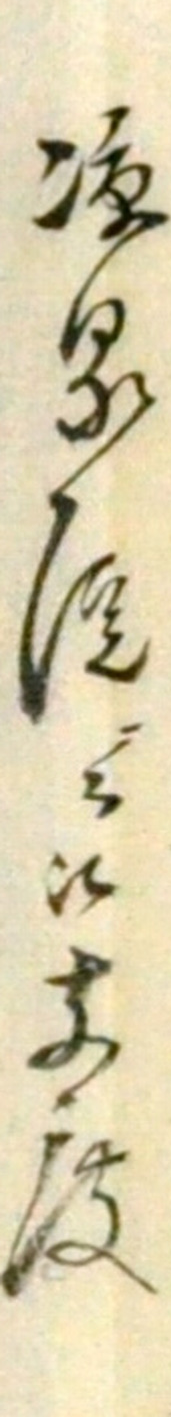涼泉院ニ而御支度
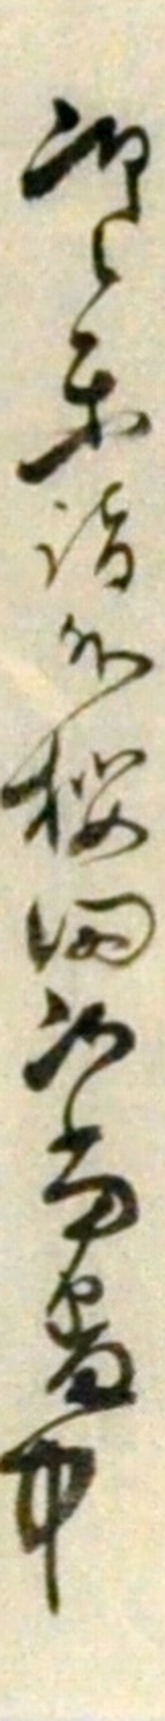御参詣外桜田御非番中
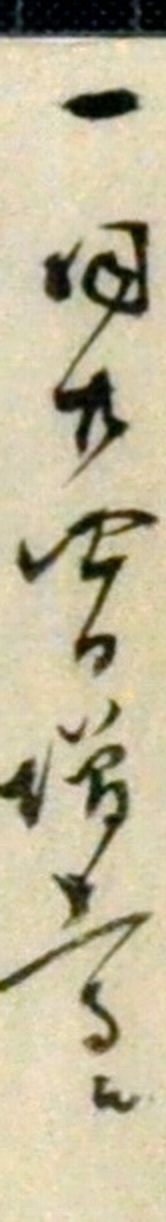一同十四日増上寺江
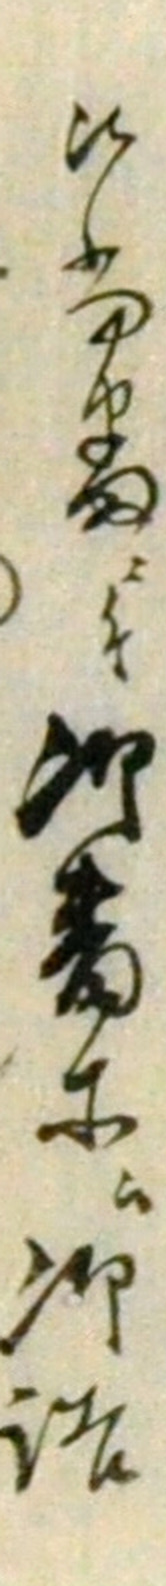御当番付御番所江御詰
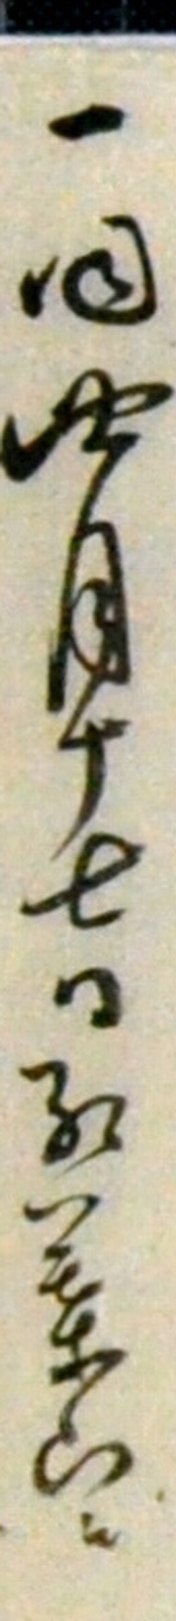一同年七月十四日紅葉山江
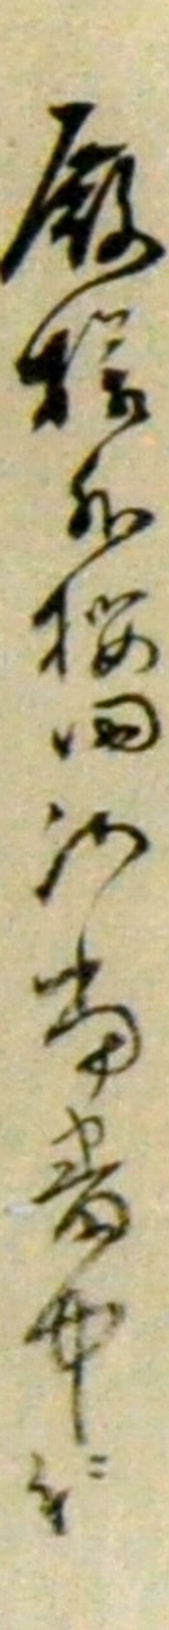御成外桜田御当番中ニ付

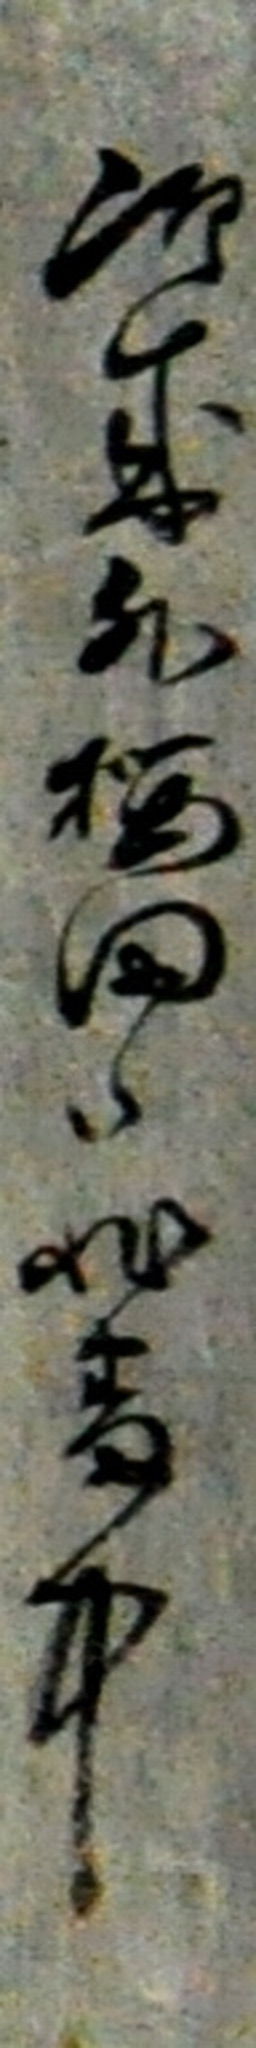御成外桜田御非番中
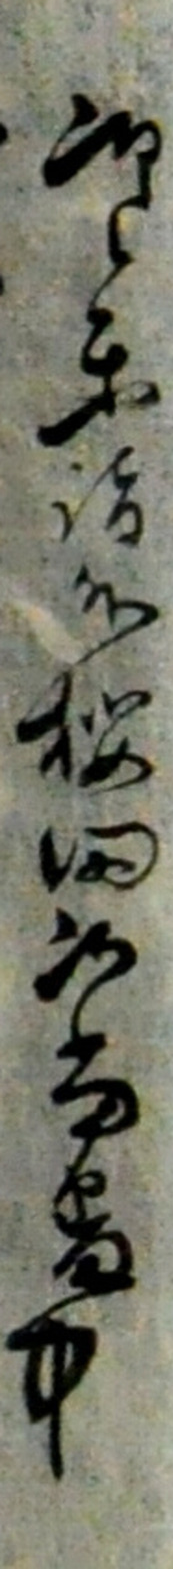御参詣外桜田御当番中
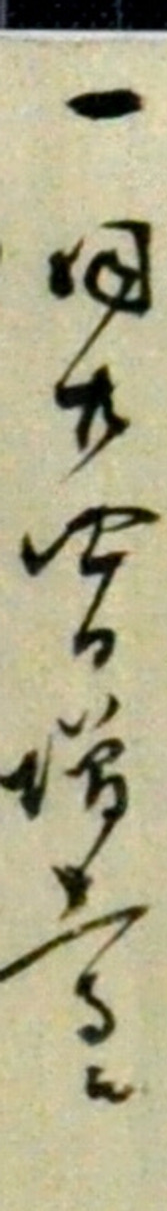一同廿四日増上寺江
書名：覚
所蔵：伊那市立高遠町図書館・合同会社AMANE
